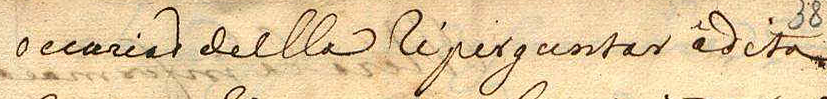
occaziaõ de ella Ré perguntar â dita
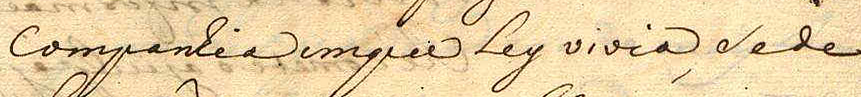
Companhia em que Ley vivia, se de
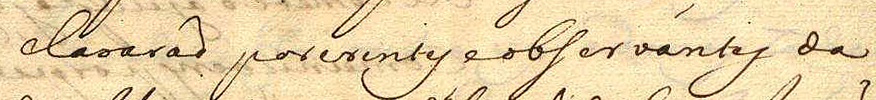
clararaõ por crentes e observantes da
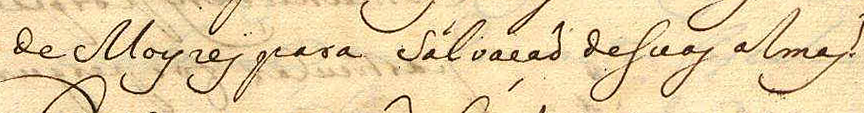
de Moyzes para Salvaçaõ de suas almas?
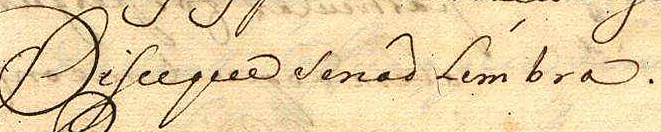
Disse que se naõ Lembra.
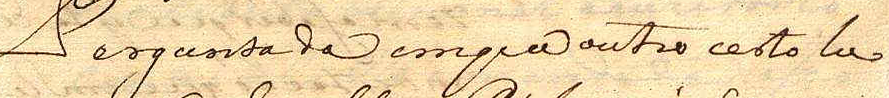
Perguntada em que outro certo lu
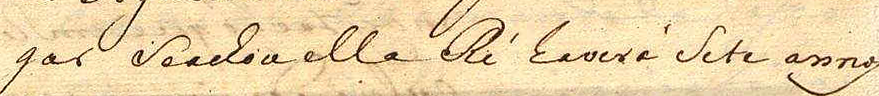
gar se achou ella Ré haverá Sete annos
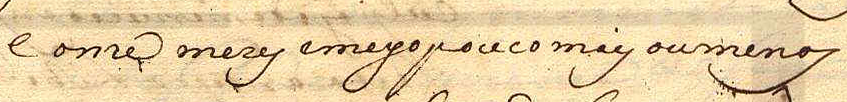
e onze mezes e meyo pouco mais ou menos
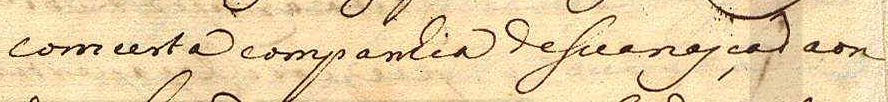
com certa companhia de sua nasçaõ aon
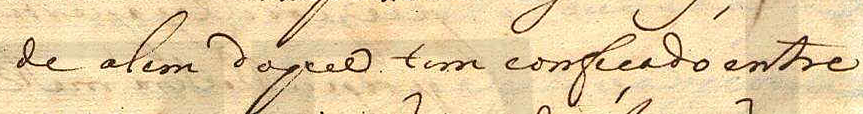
de alem do que tem confeçado entre
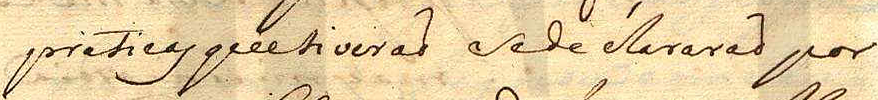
praticas que tiveraõ se declararaõ por
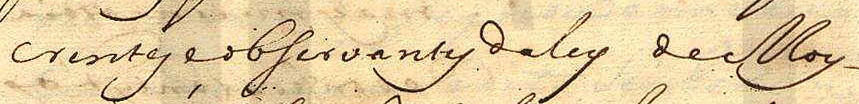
crentes e observantes da ley de Moy
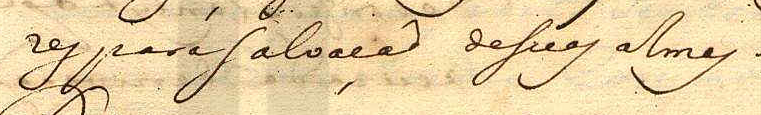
zes para salvaçaõ de suas almas?
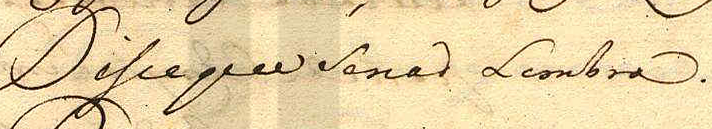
Disce que se naõ Lembra.
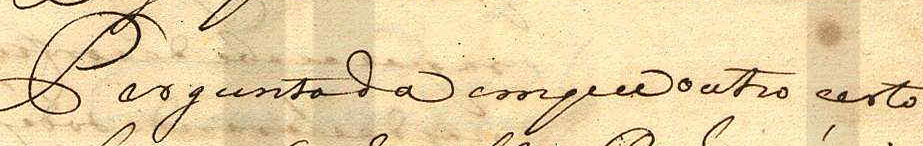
Perguntada em que outro certo
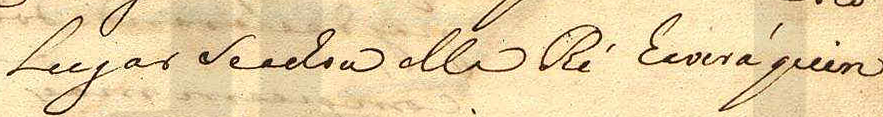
Lugar se achou ella Ré haverá quin
